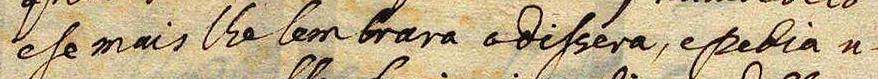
e se mais lhe lembrara o dissera, e pedia u
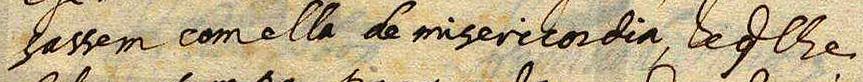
sassem com ella de misericordia, e q̄ lhe
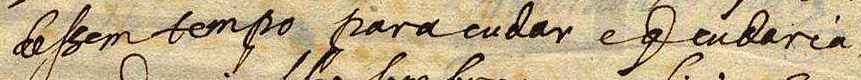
dessem tempo para cudar e q̄ cudaria
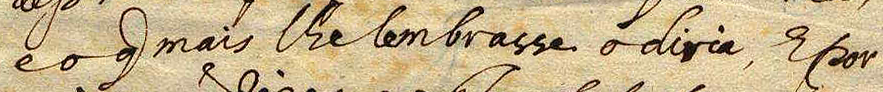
e o q̄ mais lhe lembrasse o diria, E por
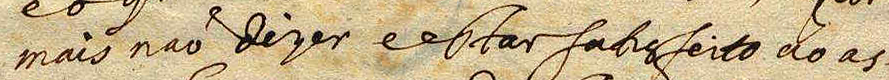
mais naõ dizer e estar satisfeito do as
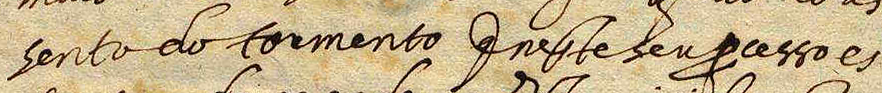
sento do tormento q̄ neste seu ꝓcesso es
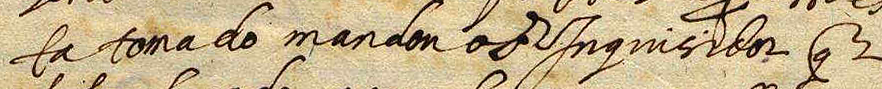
ta tomado mandou o sor Jnquisidor q̄
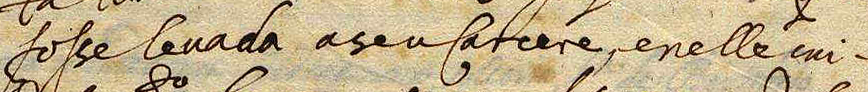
fosse leuada a seu Carcere, e nelle cui
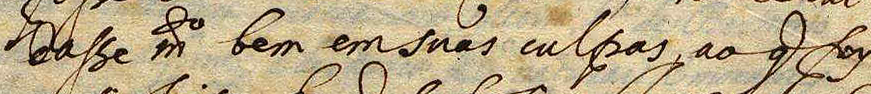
dasse mto bem em suas culpas, ao q̄ foy
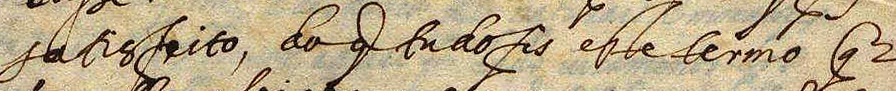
satisfeito, do q̄ tudo fis este termo q̄
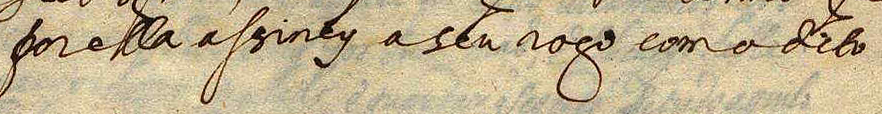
por ella assiney a seu rogo com o dito
